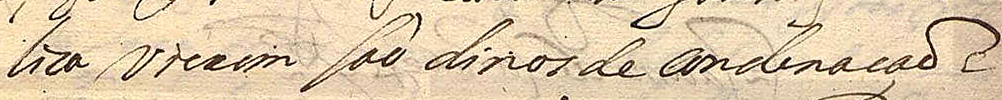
lica vierem saõ dinos de condenaçaõ e
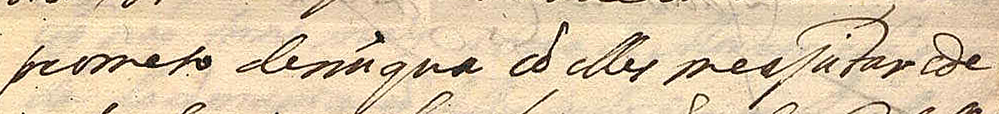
prometo de nūqua cō elles me ajūtar e de
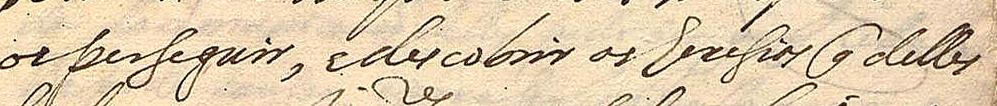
os perseguir, E descobrir as heresias q̄ delles
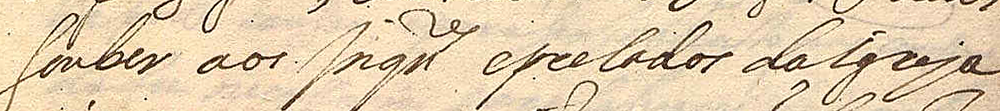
souber aos Jnqures e prelados da Igreja
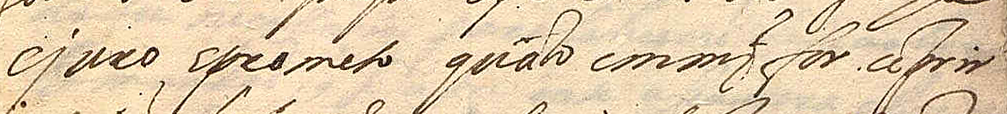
e juro, E prometo quāto em mj̄ for cōprir
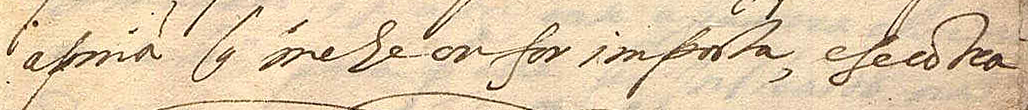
a pniā q̄ me he ou for imposta, e se cōtra
